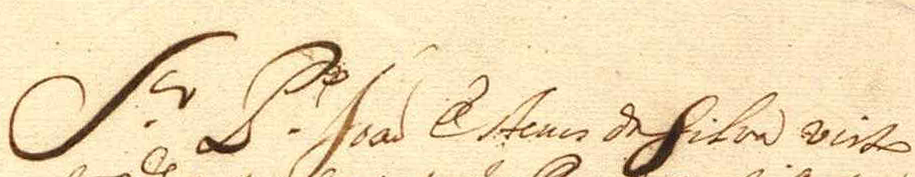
S.or P.e Joaõ Esteues da silva visto
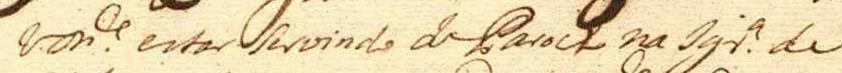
v. m.ce estar servindo de Parocho na Igr.a de
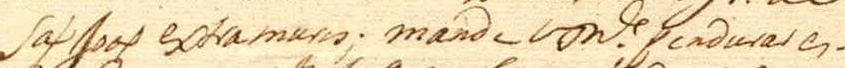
Saõ Joaõ extramuros; mande vm.ce pendurar es
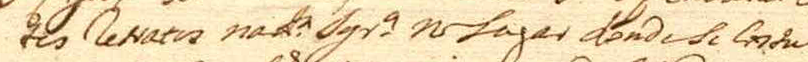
tes Retratos na d̄.a Igr.a no Lugar donde se costu
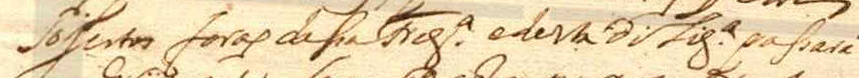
sojeitos foraõ dessa Freg.a e desta dilig.a passará
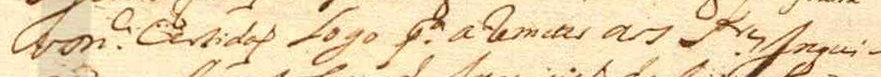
vm.ce Certidaõ Logo p.a a Remeter aos S.res Jnqui
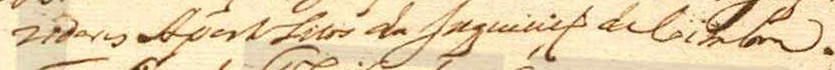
zidores Apostolicos da Jnquisiçaõ de Coimbra.
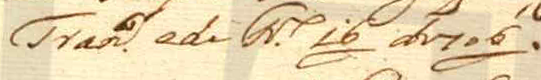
Tran.co e de Fr.o i6 d̄ 706.
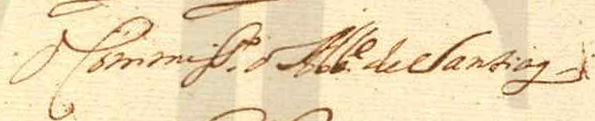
O Commiss.o o Abb.e de Santiago
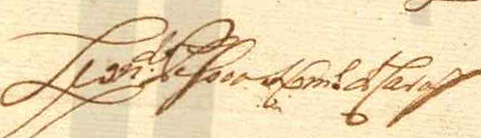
Leon.do Pessoa Homē d̄ Caruō
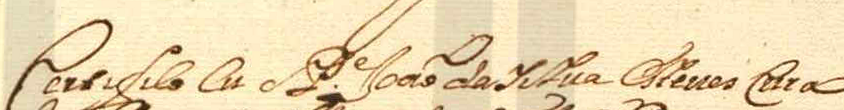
Certifico Eu o P.e Joaõ da silua Esteues Cura
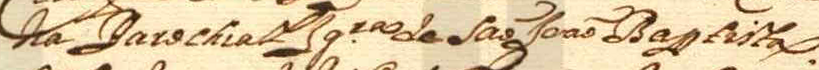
na Parochial Jg.ra de Saõ Joaõ Baptista
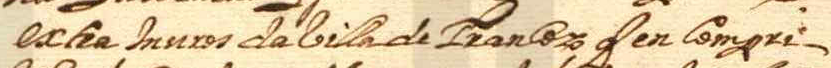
extramuros da Villa de Trancozo q̄ en Compri
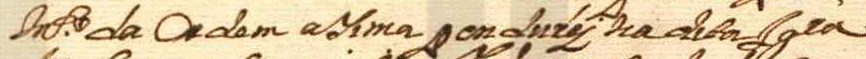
m.to da Ordem asima pendurej na dita Jgra
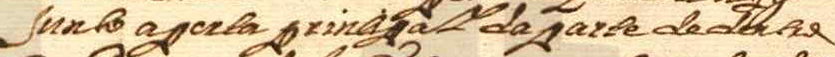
junto a porta principaL da parte de dentro
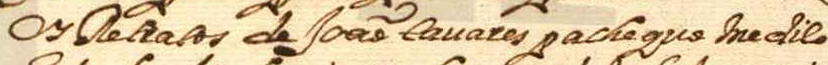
Os Retratos de Joaõ tauares pachequo medico
